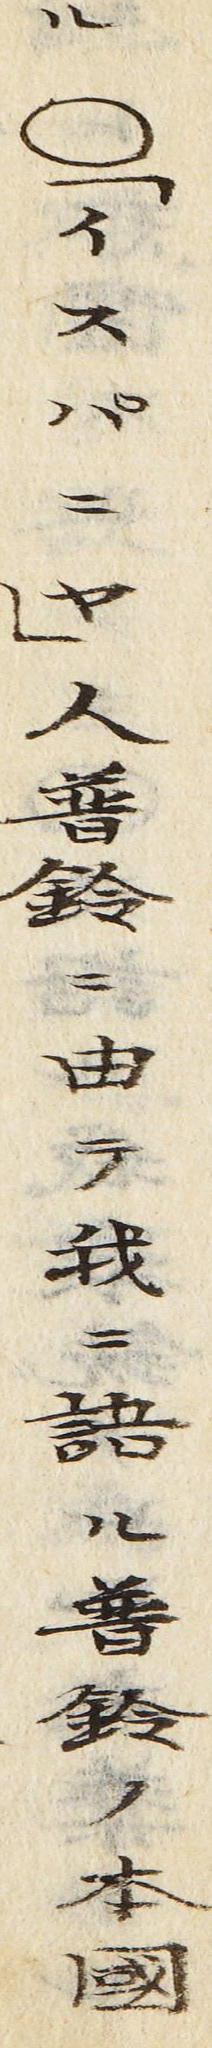ル◯「イスパニヤ」人普鈴ニ由テ我ニ語ル普鈴ノ本国
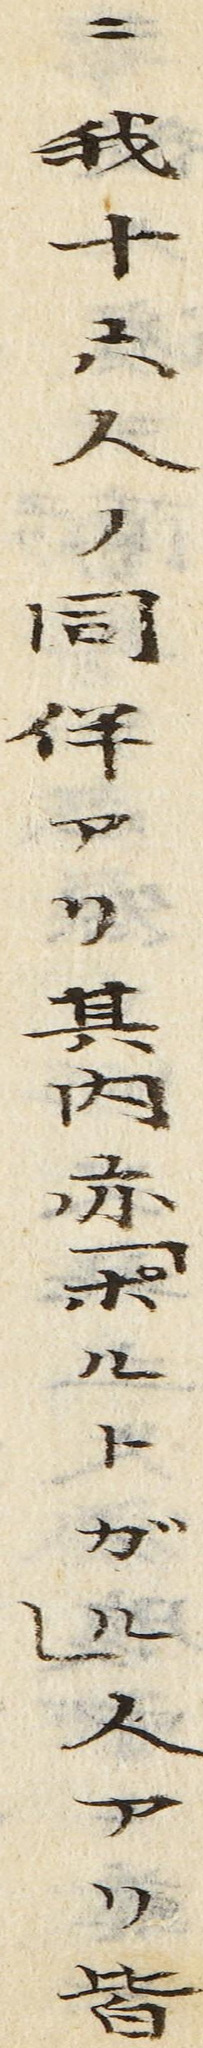ニ我十六人ノ同伴アリ其内亦「ポルトガル」人アリ皆
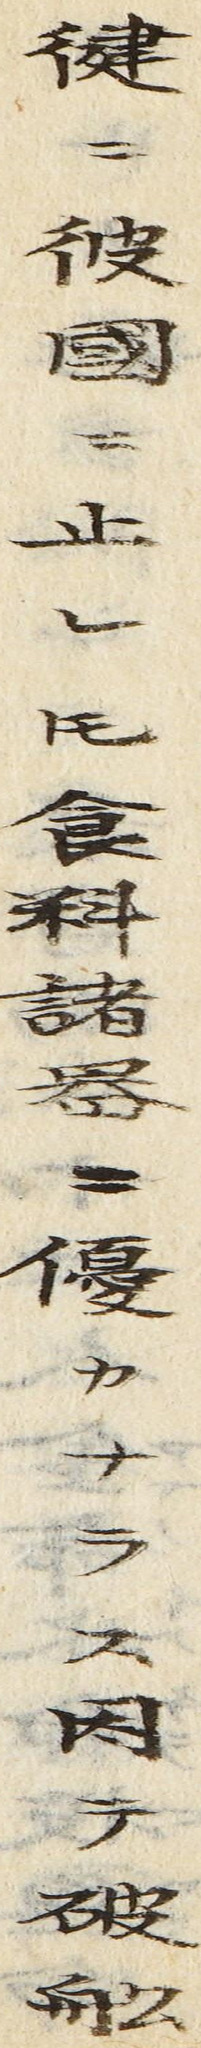徤ニ彼国ニ止レトモ食料諸器ニ優カナラス因テ破船
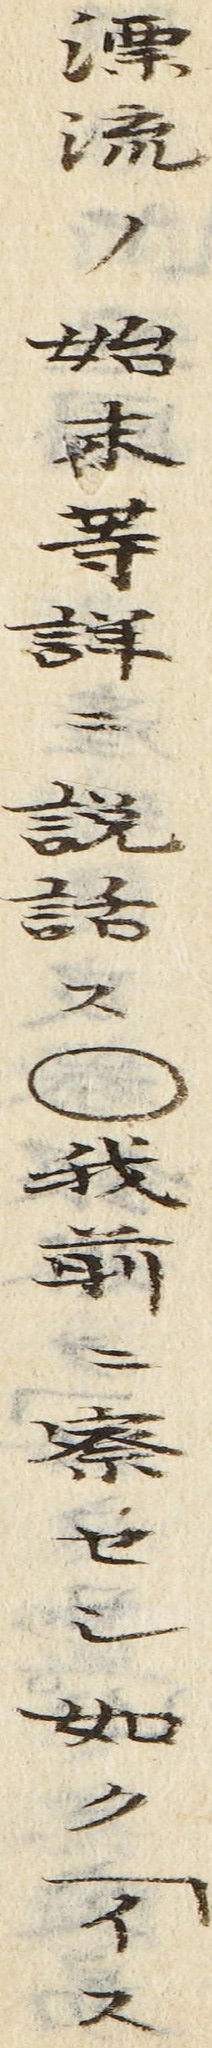漂流ノ始末等詳ニ説話ス◯我前ニ察セシ如ク「イス

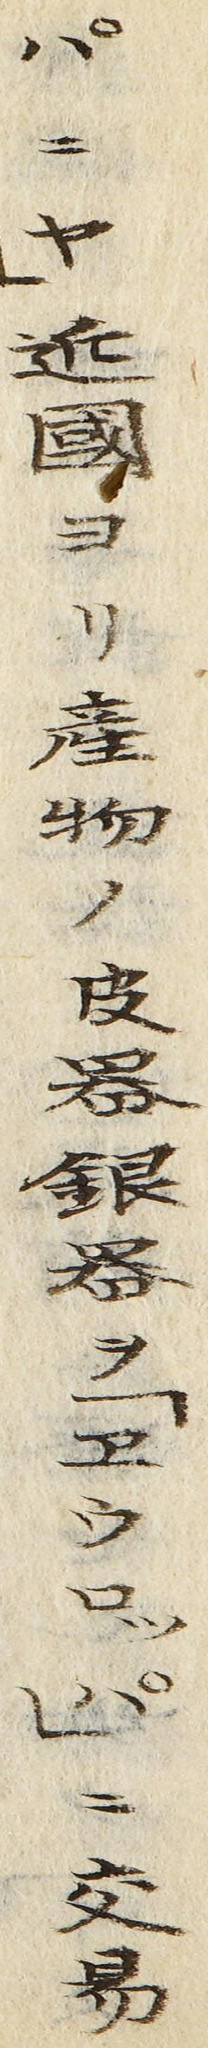パニヤ」近国ヨリ産物ノ皮器銀器「ヱウロッパ」ニ交易
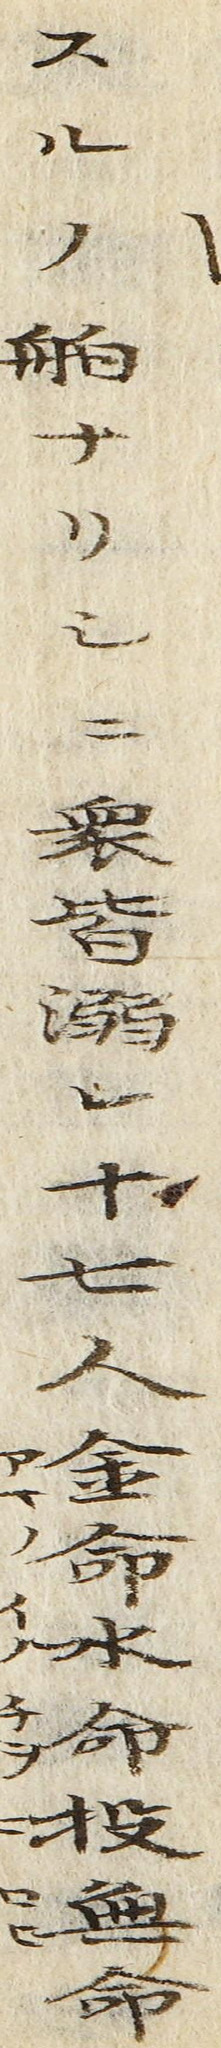スルノ舶ナリシニ衆皆溺レ十七人金命水命投無命
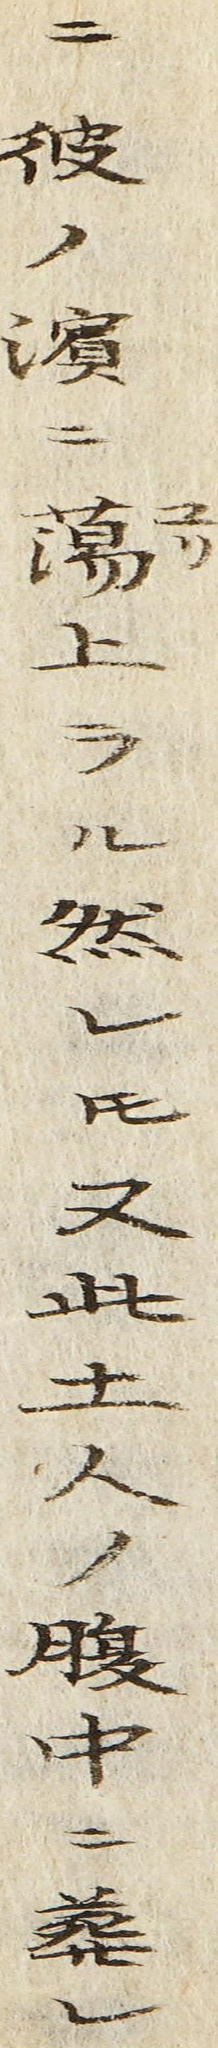ニ彼ノ浜ニ蕩上ラル然レトモ又此土人ノ腹中ニ葬レ
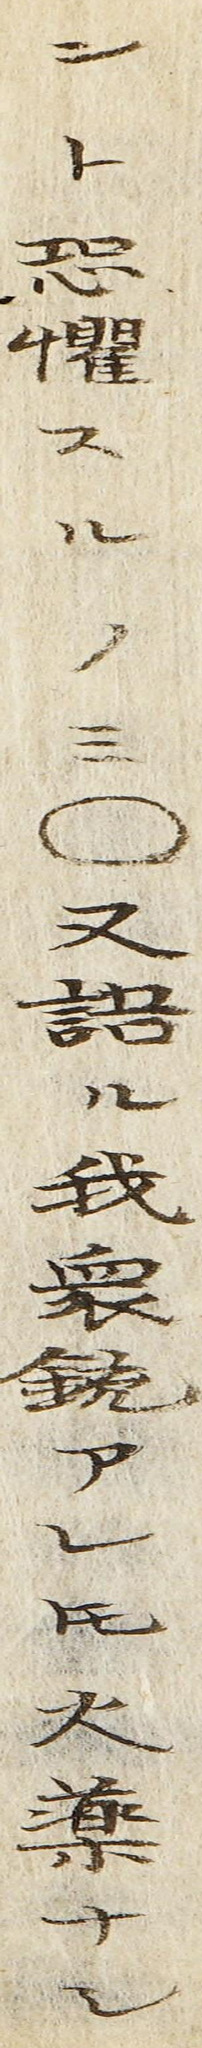ント恐懼スルノミ◯又語ル我衆銃アレトモ火薬ナシ
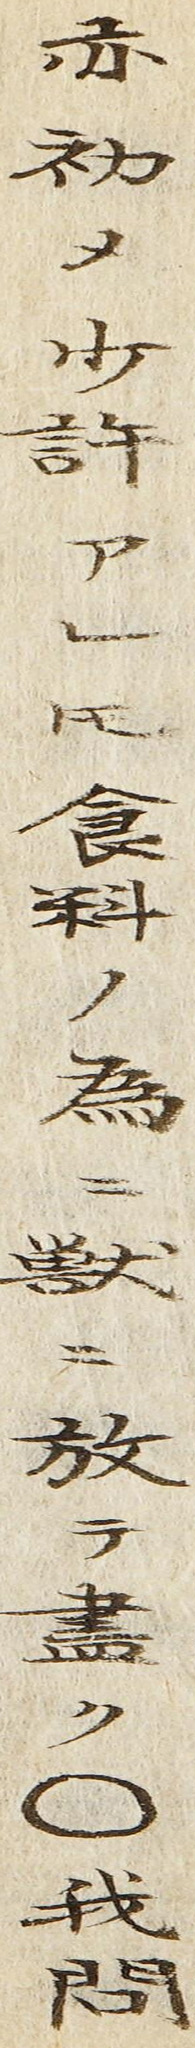亦初メ少許アレトモ食料ノ為ニ獣ニ放テ尽ク◯我問
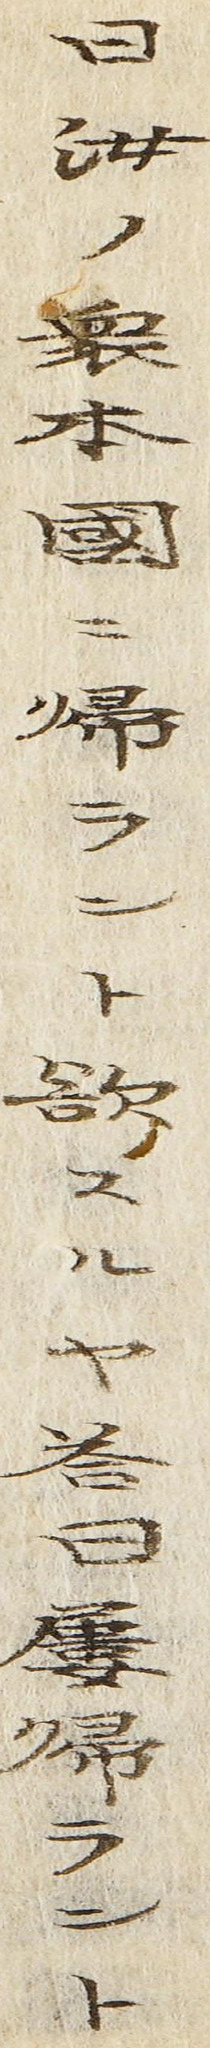曰汝ノ衆本国ニ帰ラント欲スルヤ答曰屢帰ラント
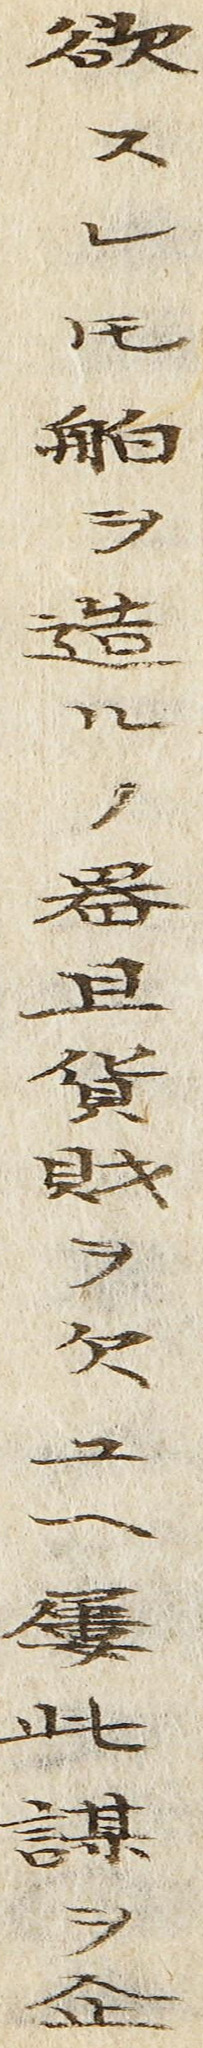欲スレトモ舶ヲ造ルノ器且貨財ヲ欠ユヘ屢此謀ヲ企
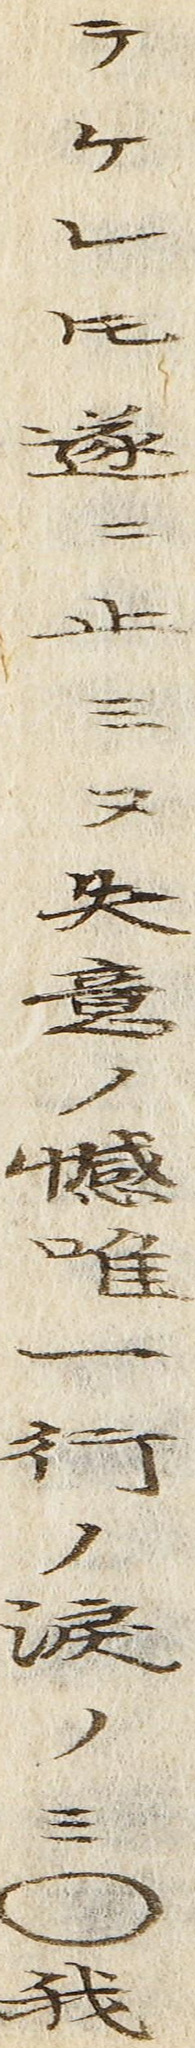テケレトモ遂ニ止ミヌ失意ノ憾唯一行ノ涙ノミ◯我
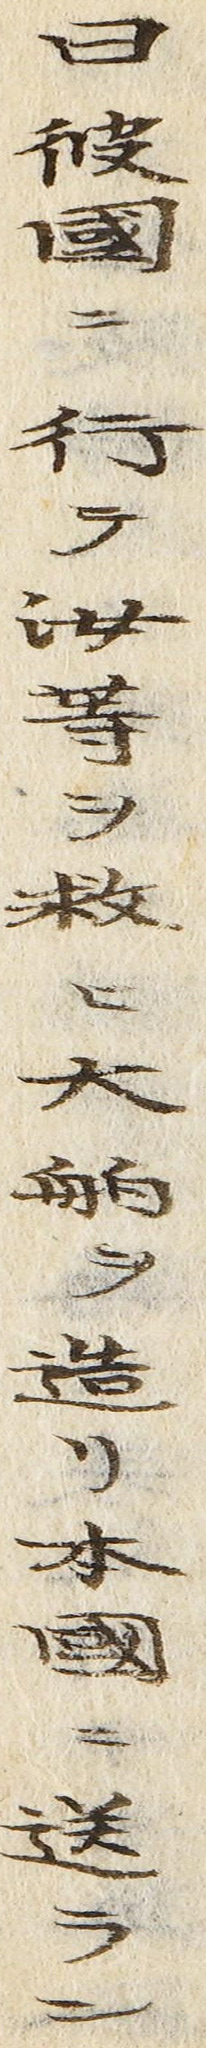曰彼国ニ行テ汝等ヲ救ヒ大舶ヲ造リ本国ニ送ラン
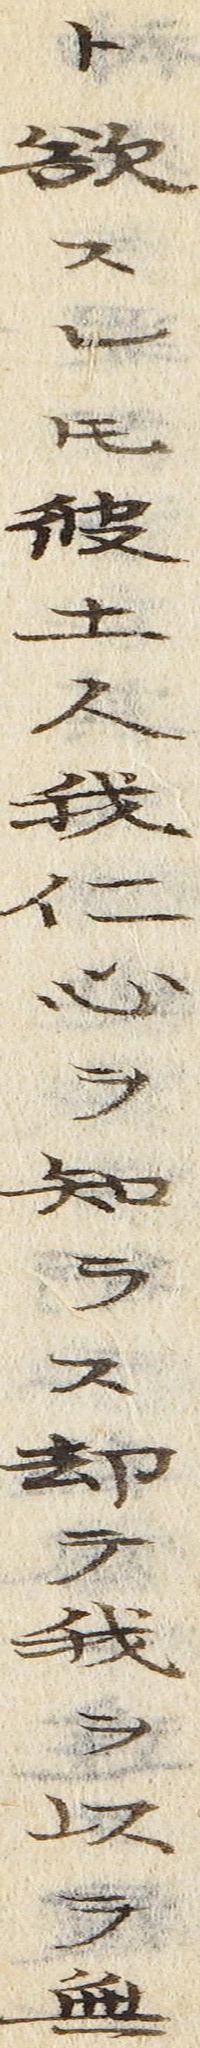ト欲スレトモ彼土人我仁心ヲ知ラス却テ我ヲ以テ無
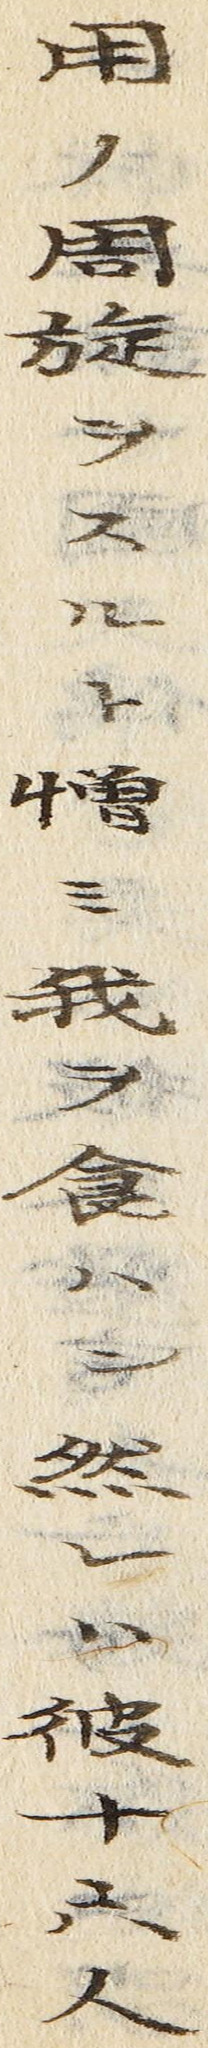用ノ周旋ヲスルト憎ミ我ヲ食ハン然レハ彼十六人
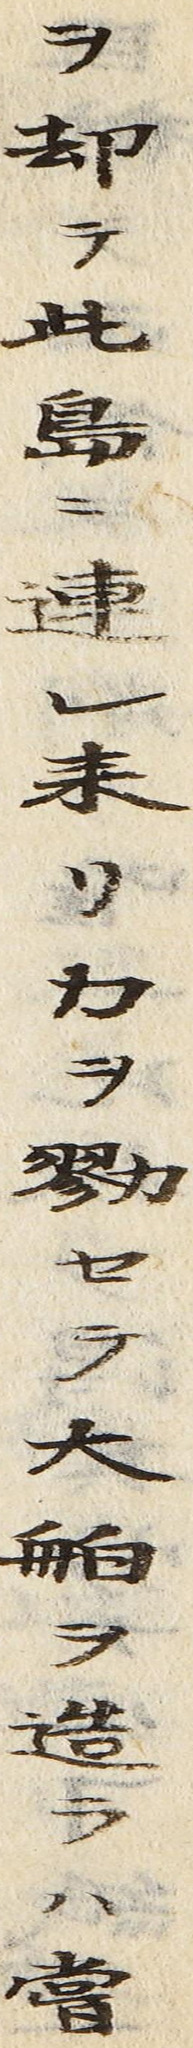ヲ却テ此島ニ連レ来リ力ヲ勠セテ大舶ヲ造ラハ嘗
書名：漂流紀事
